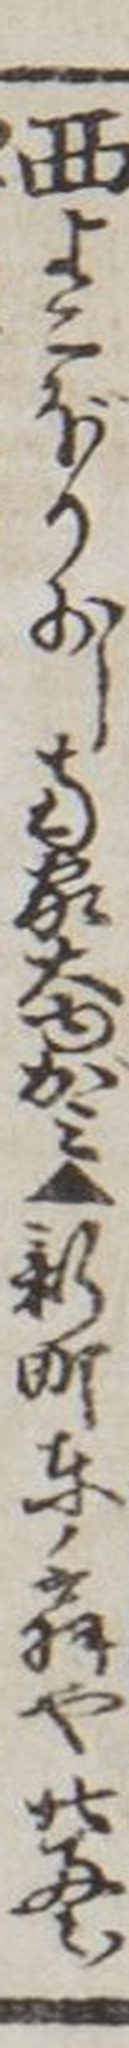西よこぼり少し南家大ゆがみ▲新町東の扇や此畳の
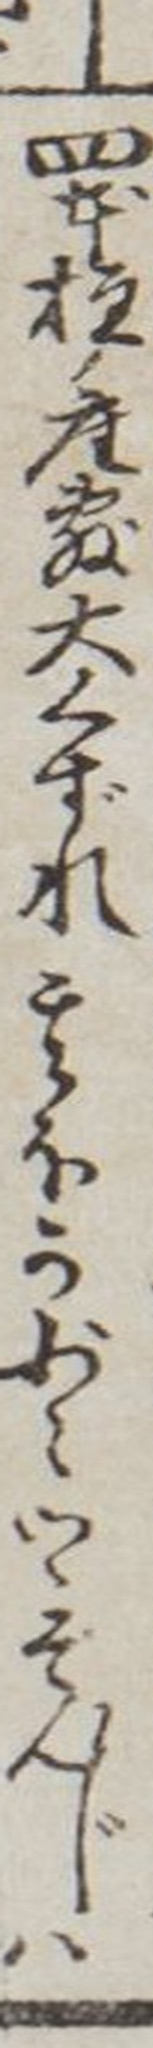四本柱の座敷大くずれ其ほか少々つゝそんじは
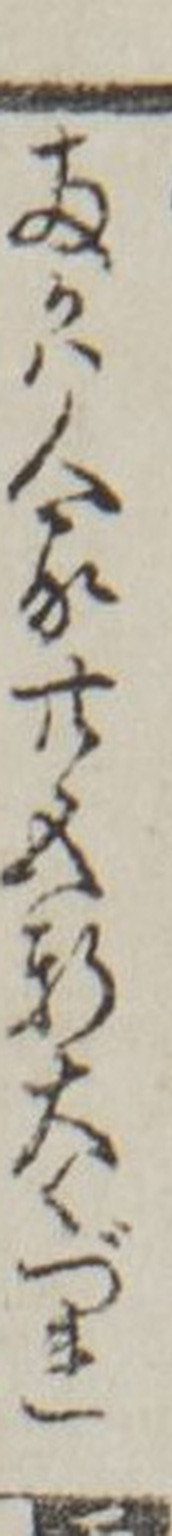両かは人家廿五軒大くづれ
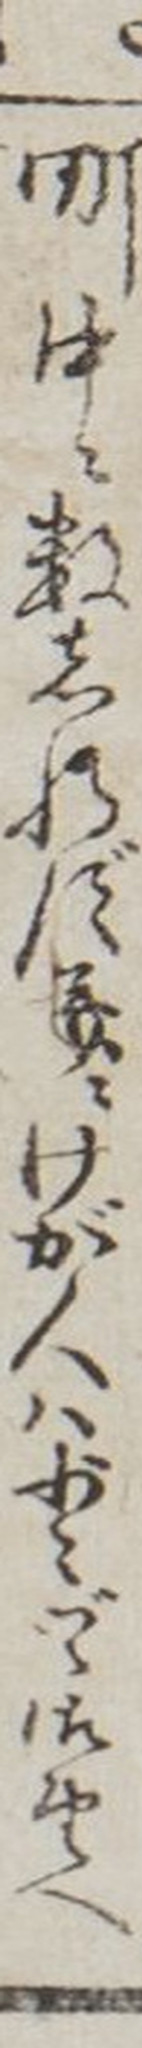町中に数しれず并にけが人は少々づゝ御座候へ
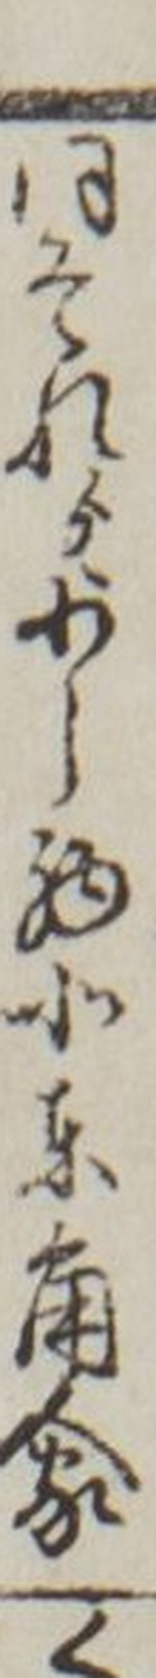同それより少し西北東角人家
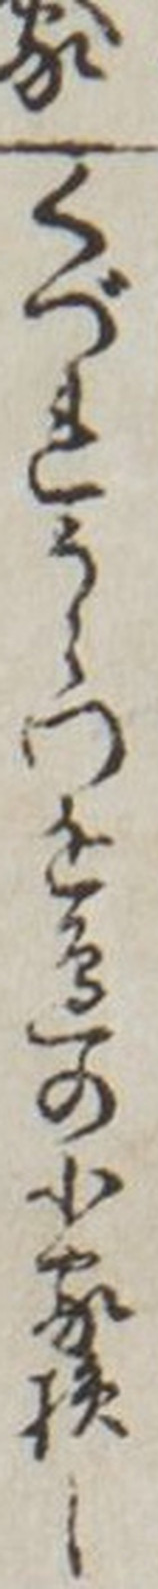くづれうら門近辺の小家損し
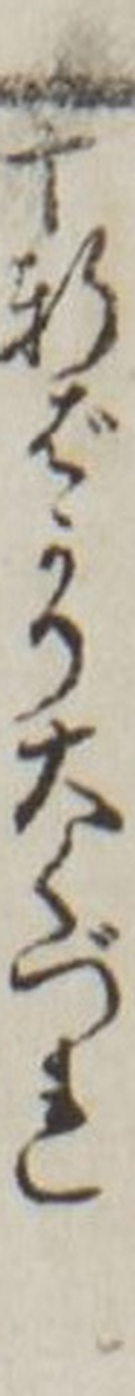十軒ばかり大くづれ
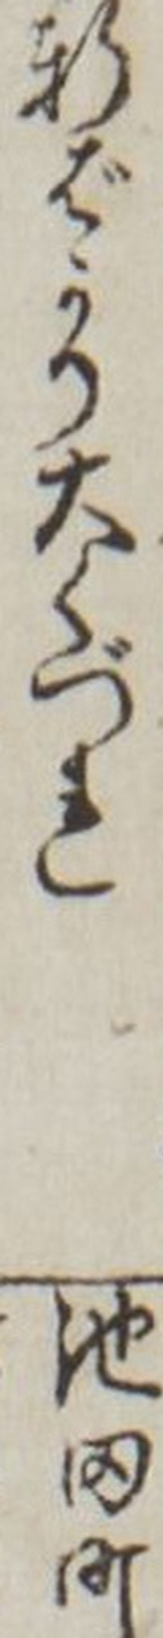十軒ばかり大くづれ
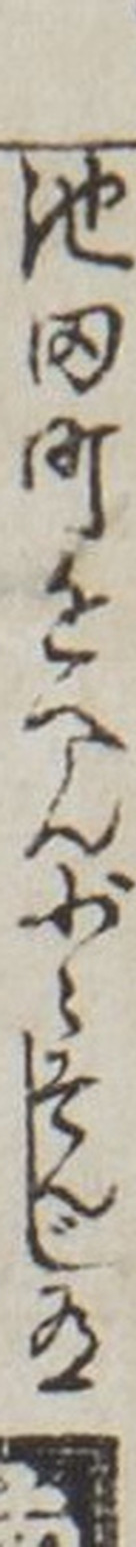池田町近へん少々そんじ有
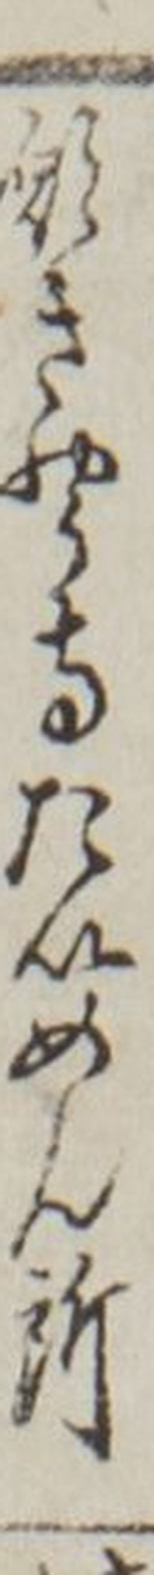願きやう寺たいめん所
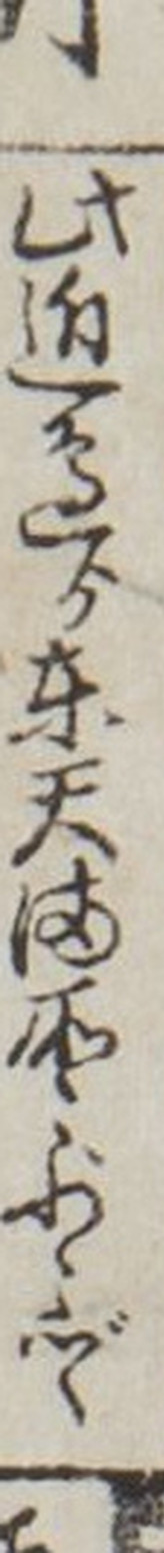此近辺より東天満所々少々づゝ
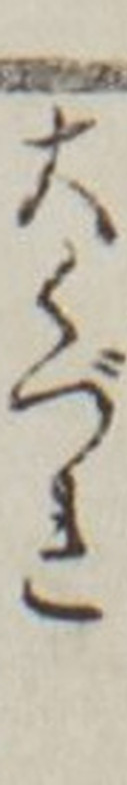大くづれ
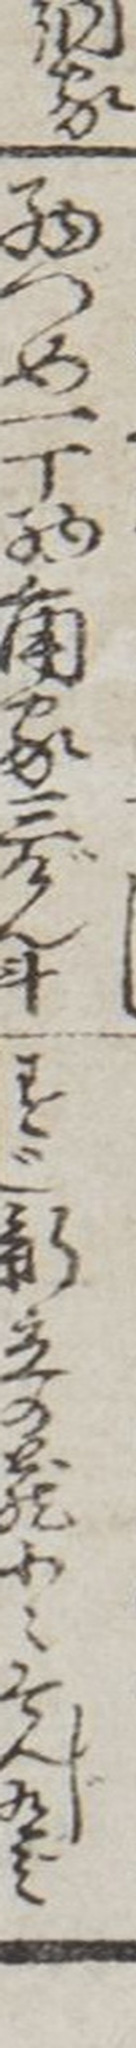西つめ一丁西角家三げん計
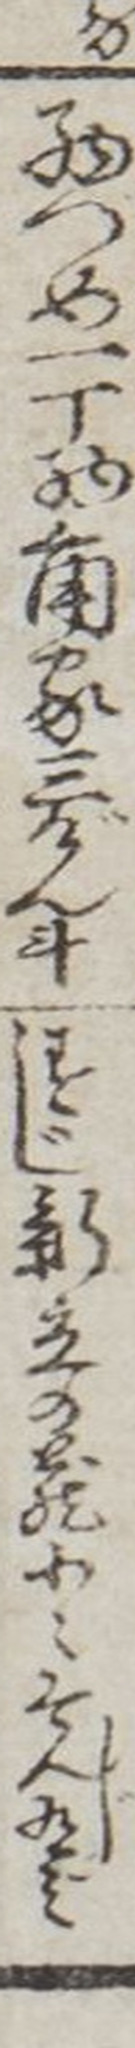すじ新立の蔵少々そんじ有之
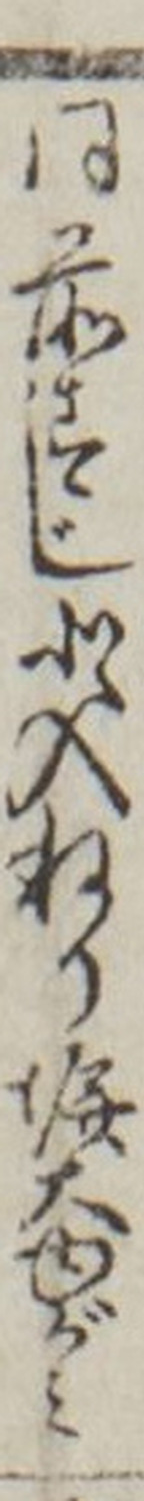同前すじ北へ入ねり塀大ゆがみ
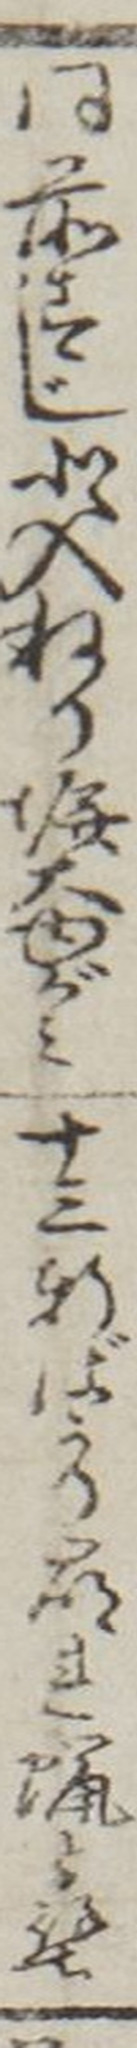同前すじ北へ入ねり塀大ゆがみ
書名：本しらべ大阪大地震の次第初編
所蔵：あいおいニッセイ同和損保株式会社
